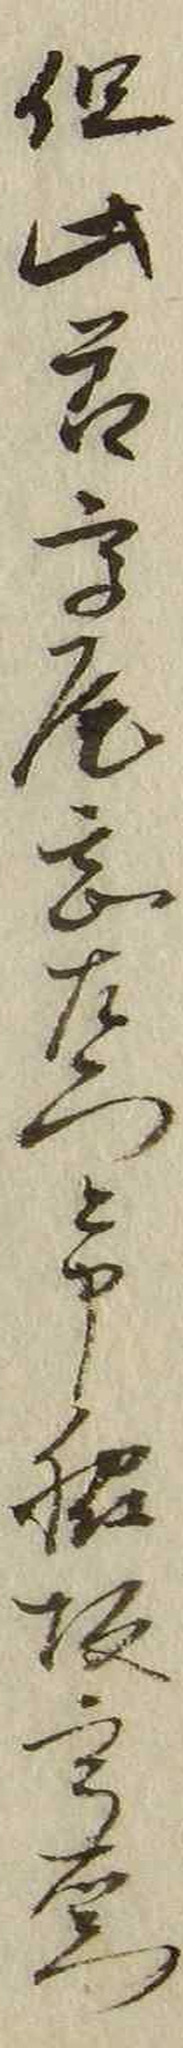但此節高尾甚左衛門と申脇坂宇右衛門
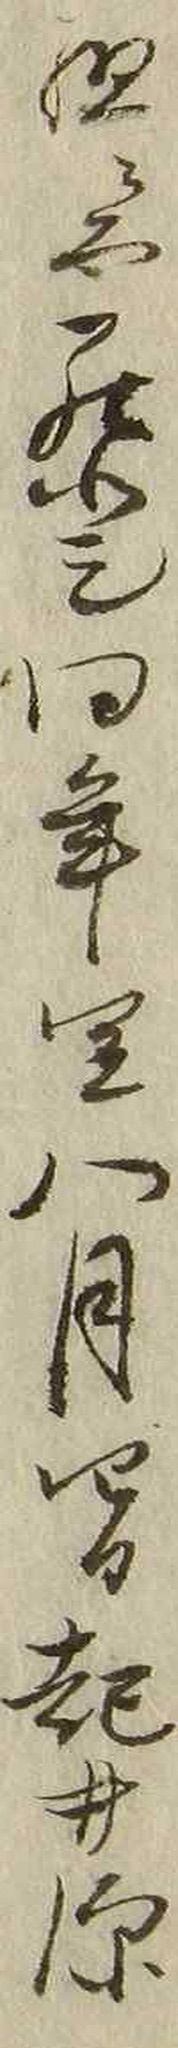組ニ而罷登同年閏八月四日起井源
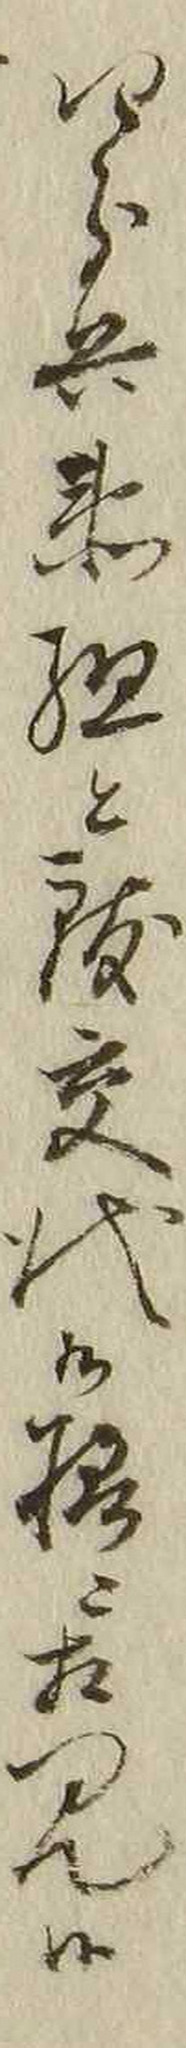四郎兵衛組と致交代候様ニ相見候
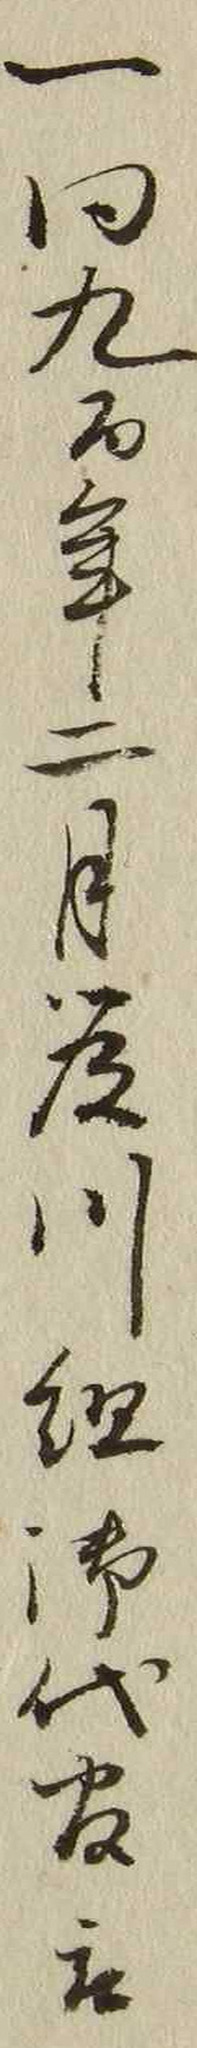一同九酉年二月笈川組御代官被
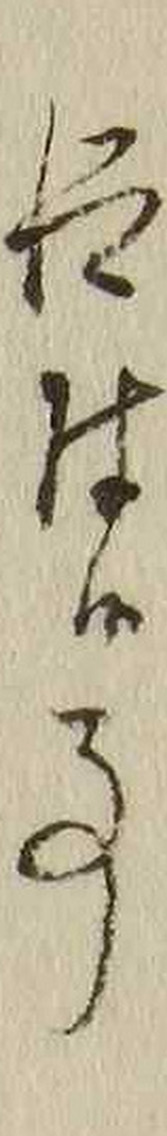仰付候事
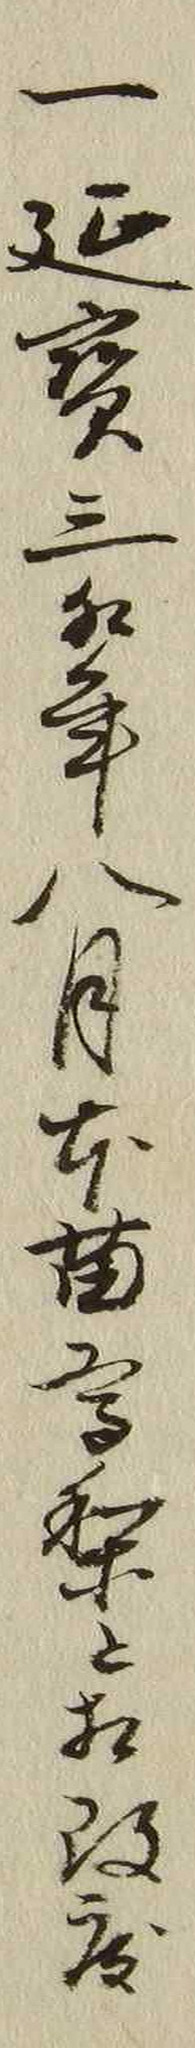一延宝三卯年八月本苗高梨と相改度
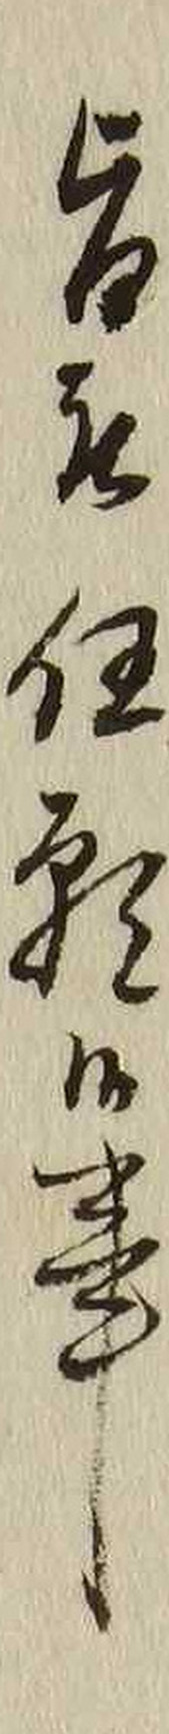旨被任願候事
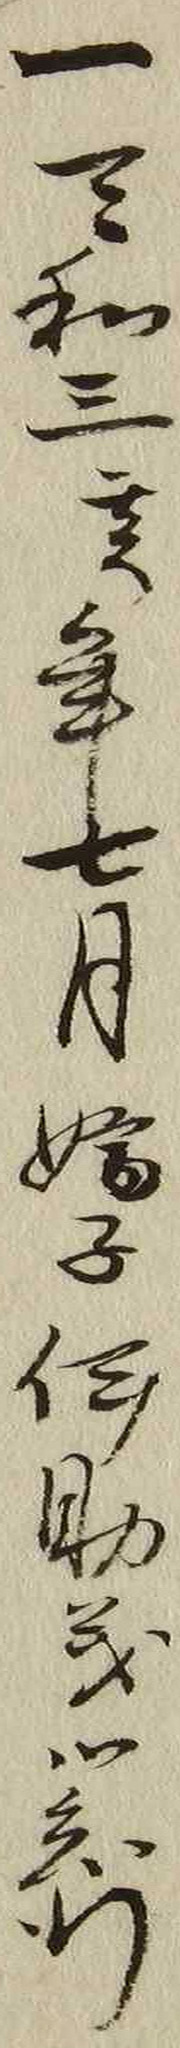一天和三亥年七月嫡子伊助義御知行
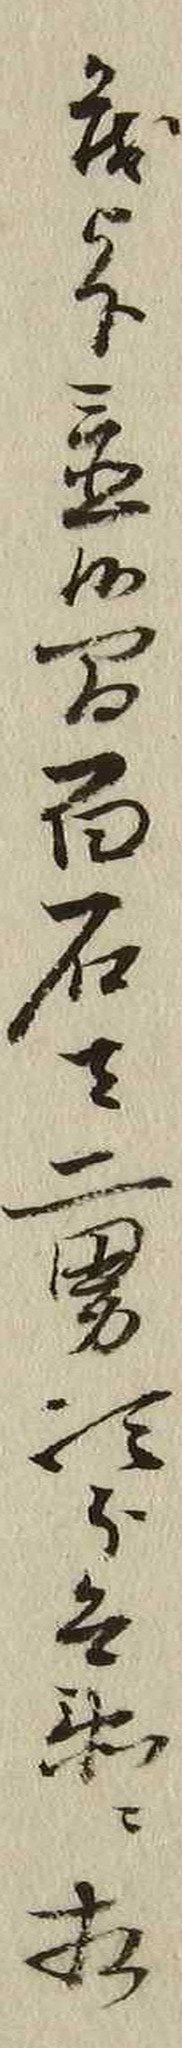茂被下置候間百石は二男次郎兵衛ニ相
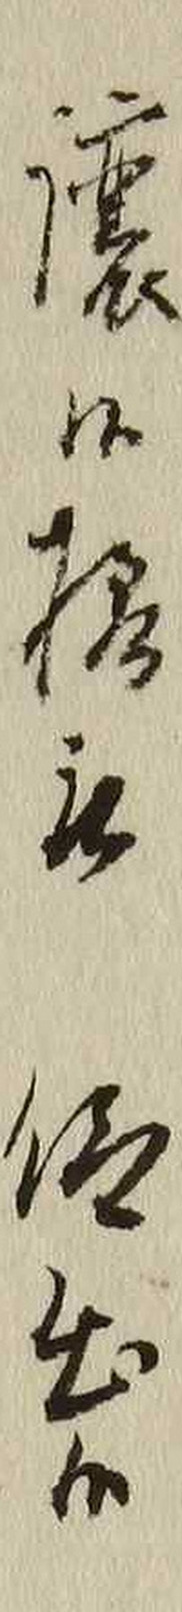譲候様被仰出候
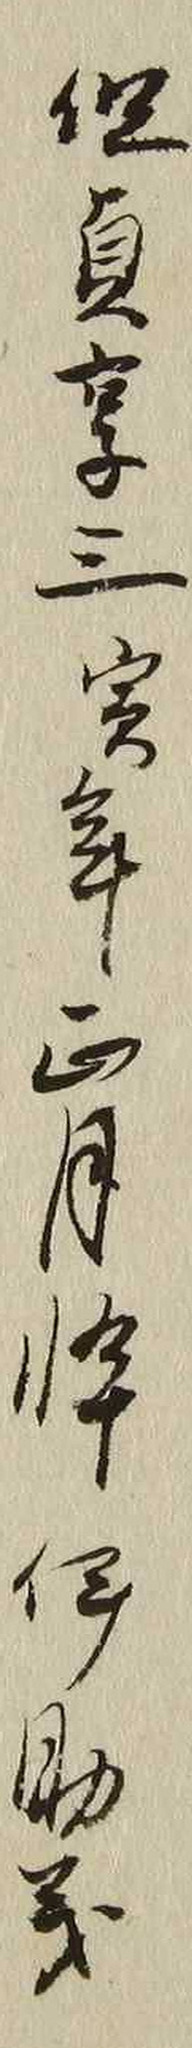但貞享三寅年正月忰伊助義
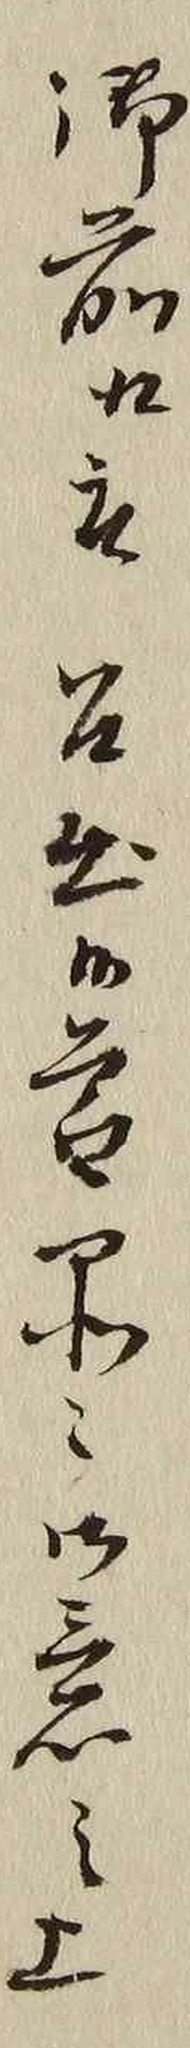御前江被召出候節品々御意之上
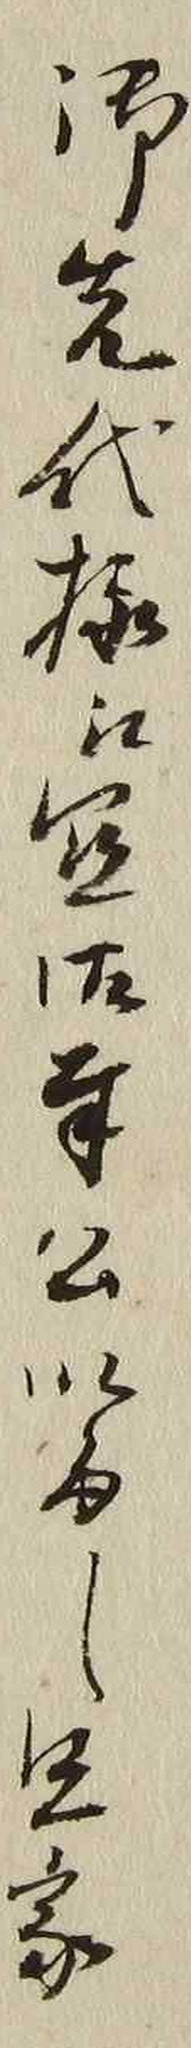御先代様江宜御奉公いたし且家
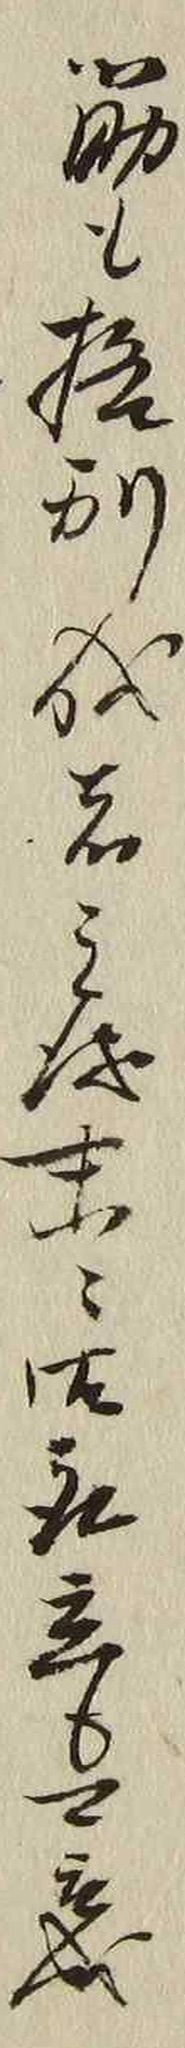筋も格別成者ニ候儀末々御取立も可被成
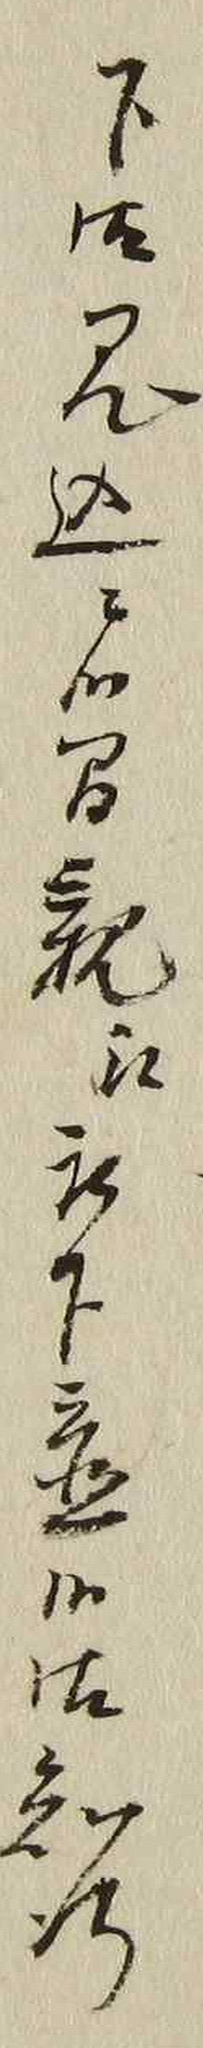下御見込ニ候間親江被下置候御知行
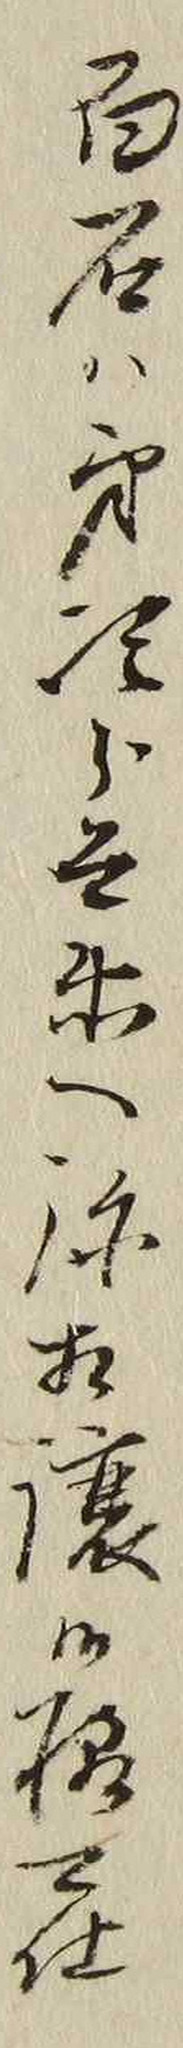百石ハ弟次郎兵衛へ弥相譲候様可仕
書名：諸士系譜　巻之359　す之部9
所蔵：会津若松市立会津図書館
